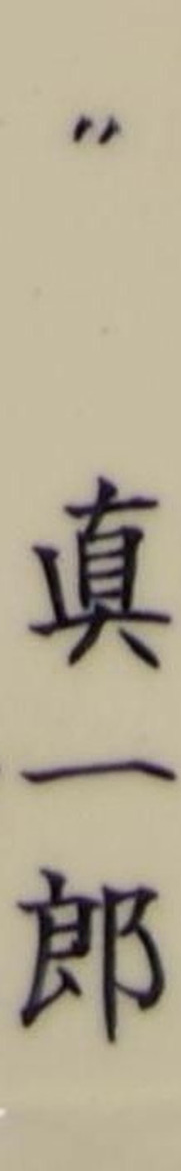真一郎
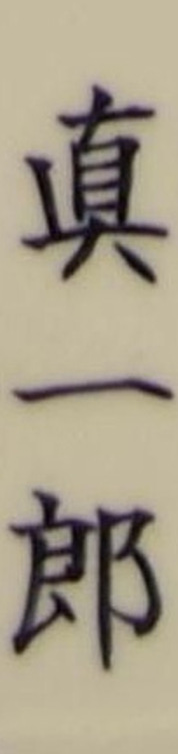真一郎
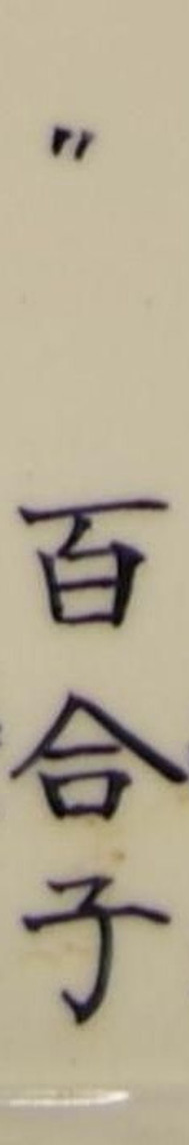百合子
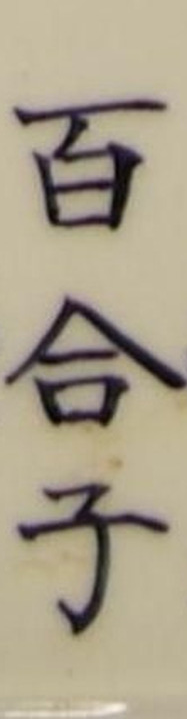百合子
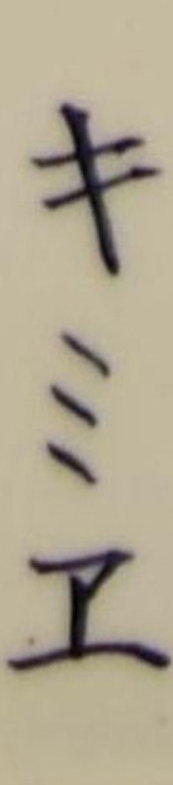キミヱ
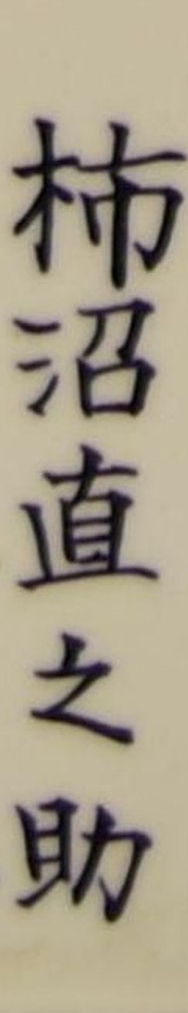柿沼直之助
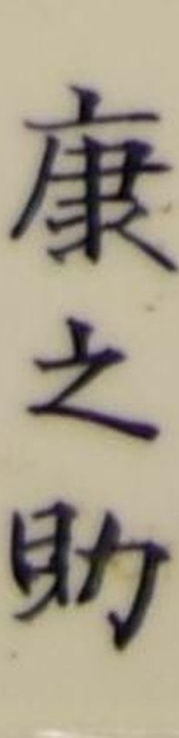康之助
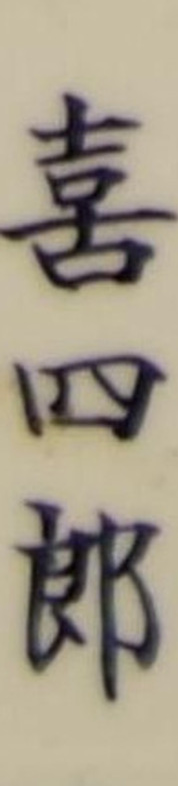喜四郎
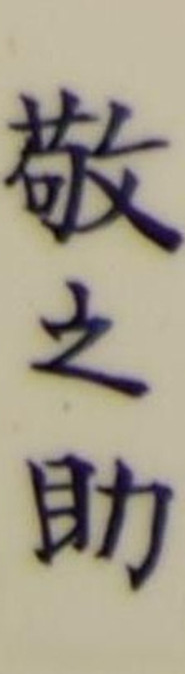敬之助

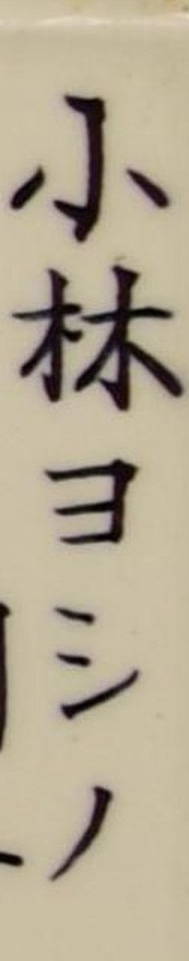小林ヨシノ
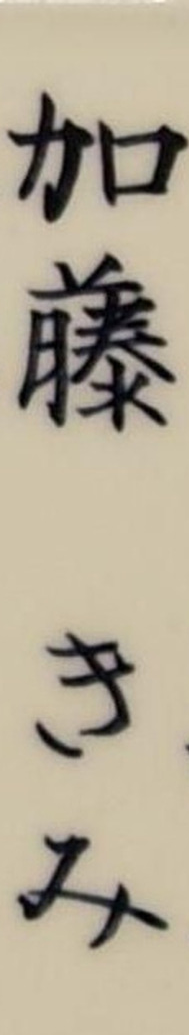加藤きみ
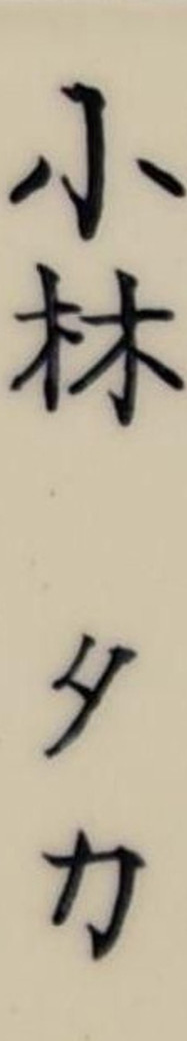小林タカ
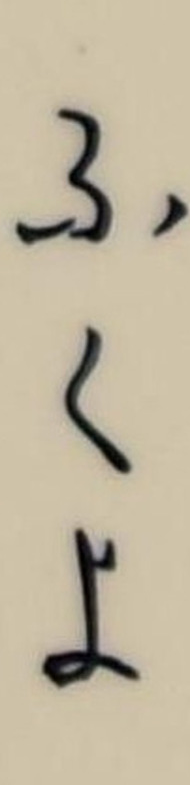ふくよ
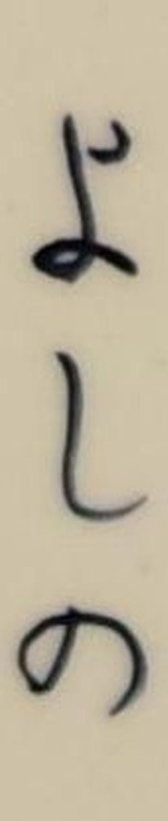よしの
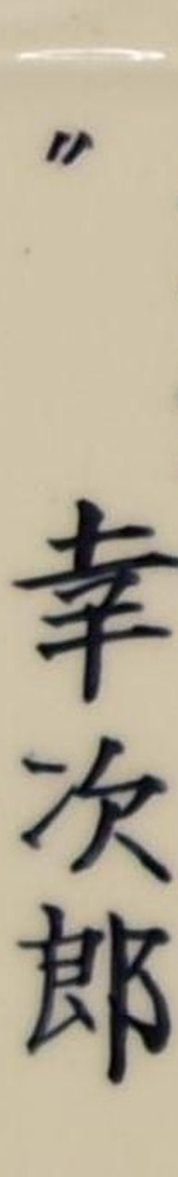幸次郎
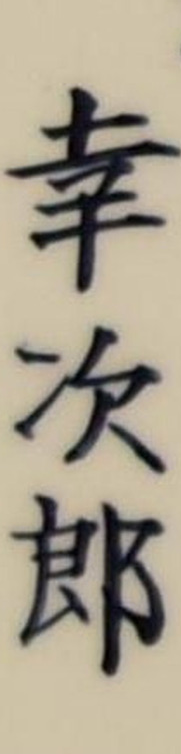幸次郎
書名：A~D
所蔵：koyasan kongobuji
